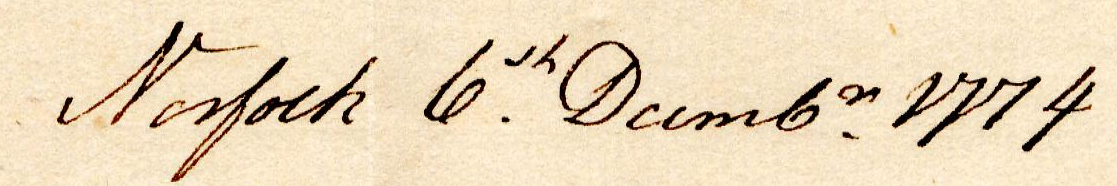Norfolk 6^th. Decemb^r. 1774
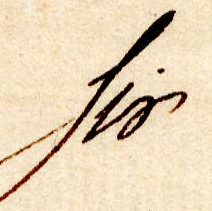Sir
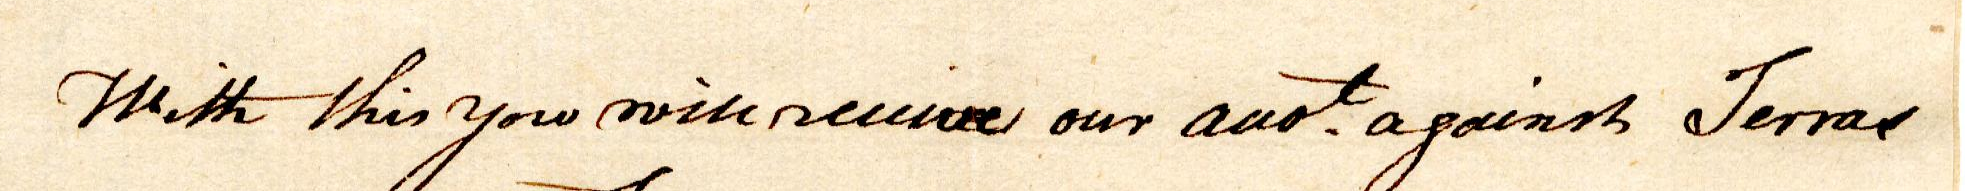With this you will receive our acco^t. against Terms
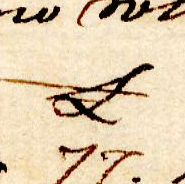£
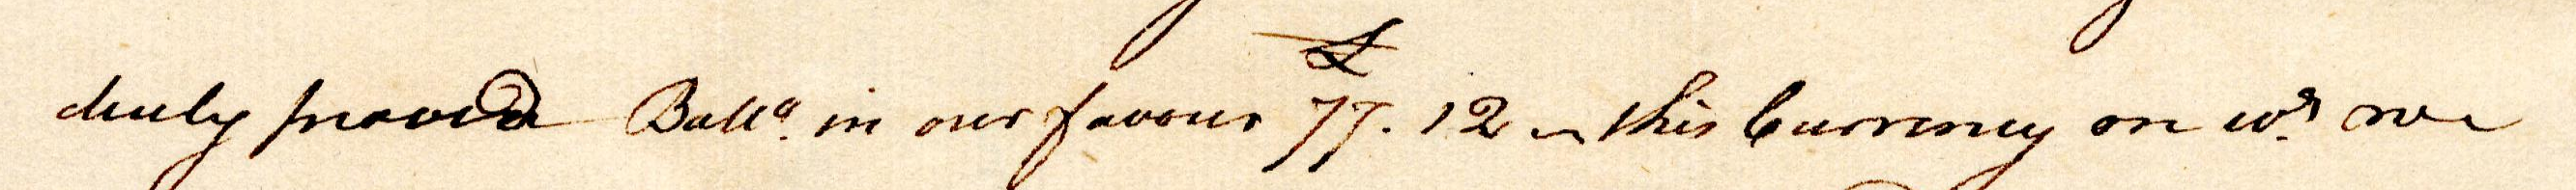duly provided Ball^ce. in our favour 77. 12. this Currency on w^ch. our
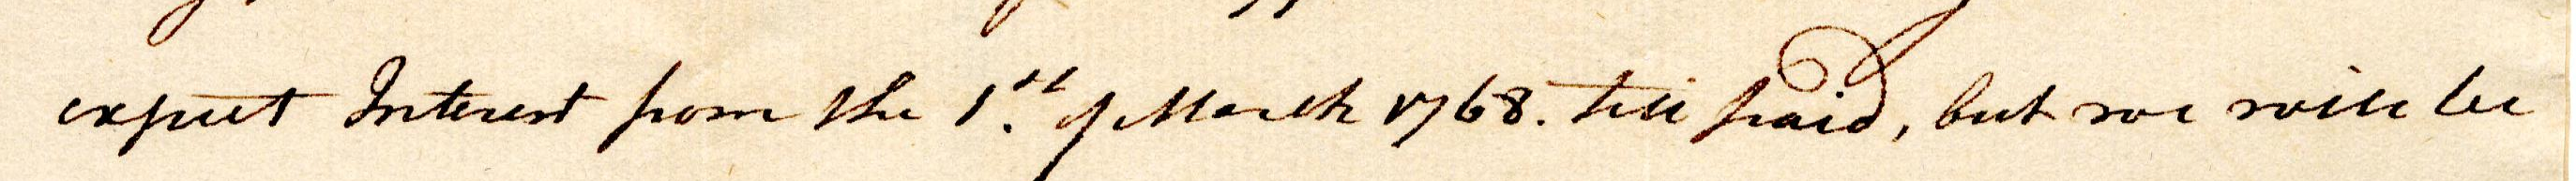expect Interest from the 1^st. of March 1768. till paid, but we will be
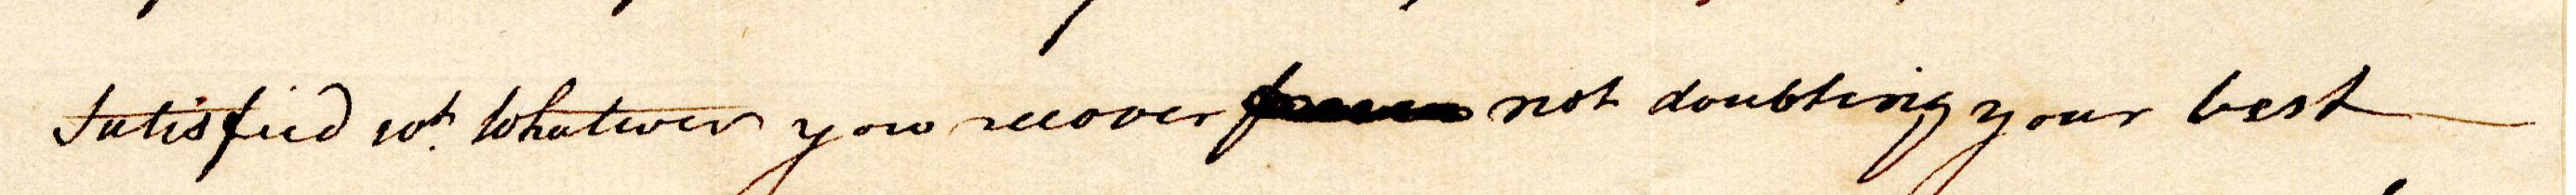Satisfied w^ch. Whatever you recover [from] not doubting your best
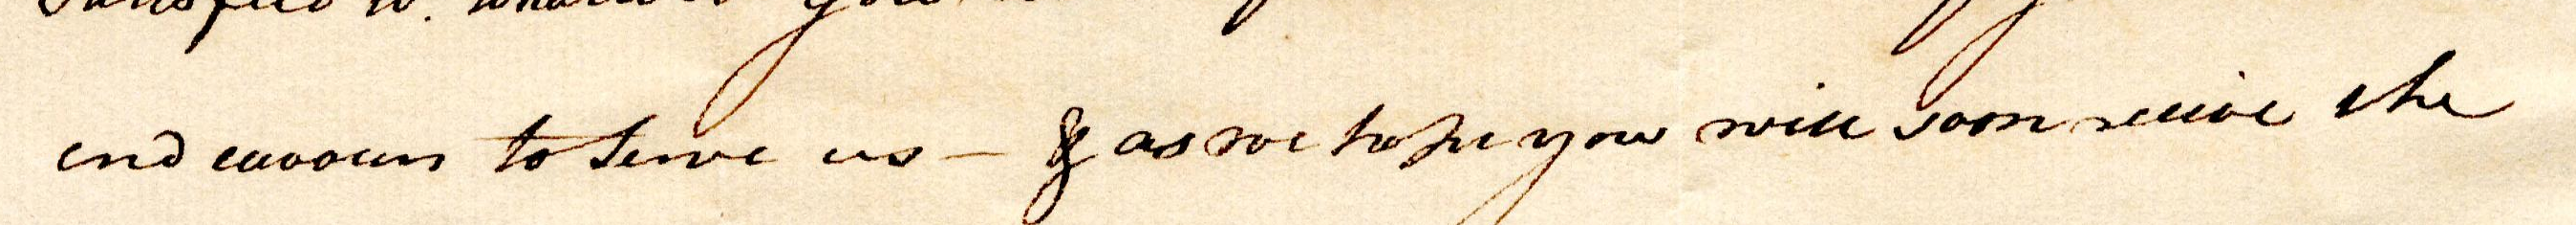endeavours to Serve us- & as we hope you will soon receive the
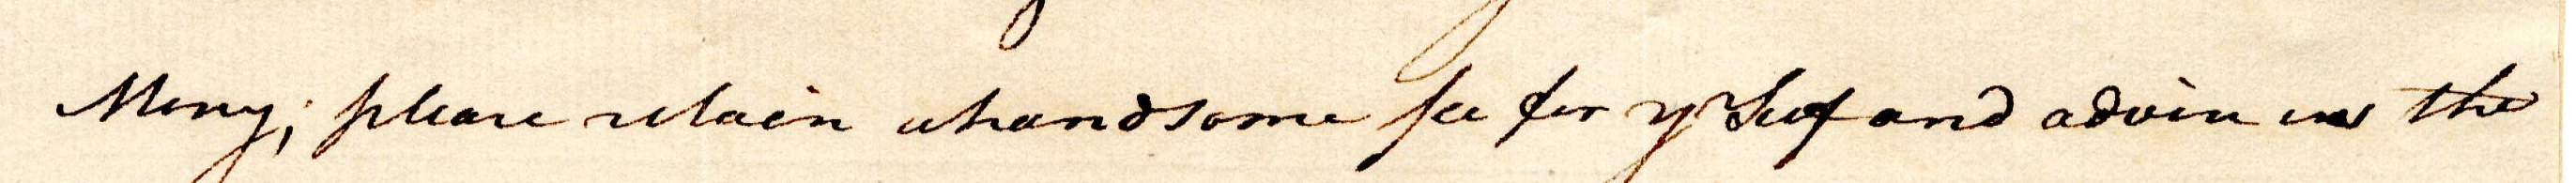Mony; please retain a handsome fee for y^r Srv and advice in the
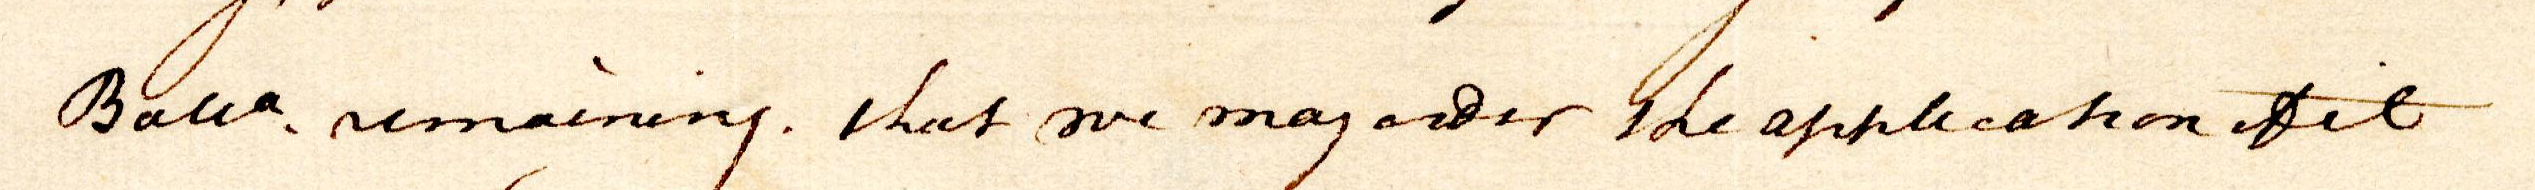Ball^ce remaining. that we may order the application of it
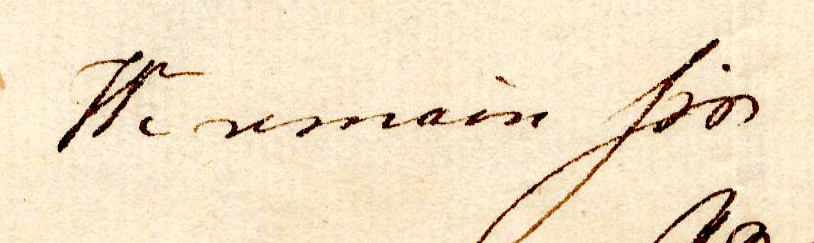We remain Sir
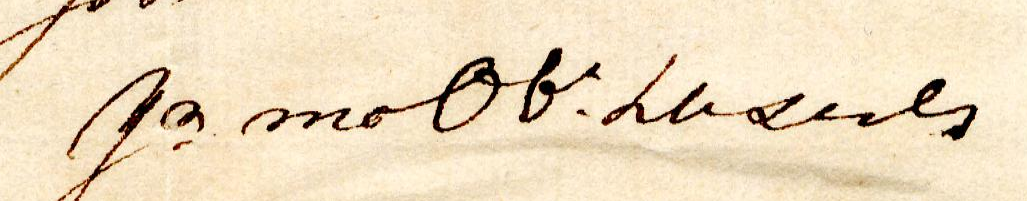Y^r. mo Ob^t. hble servt
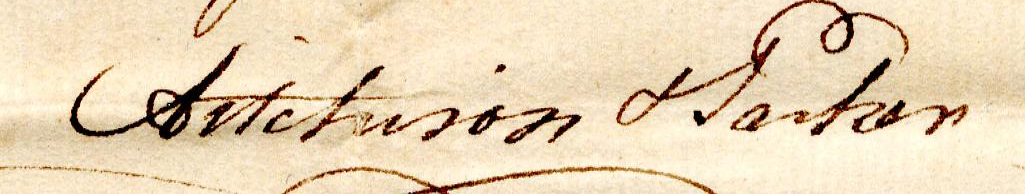Hutcheson & Sarker
